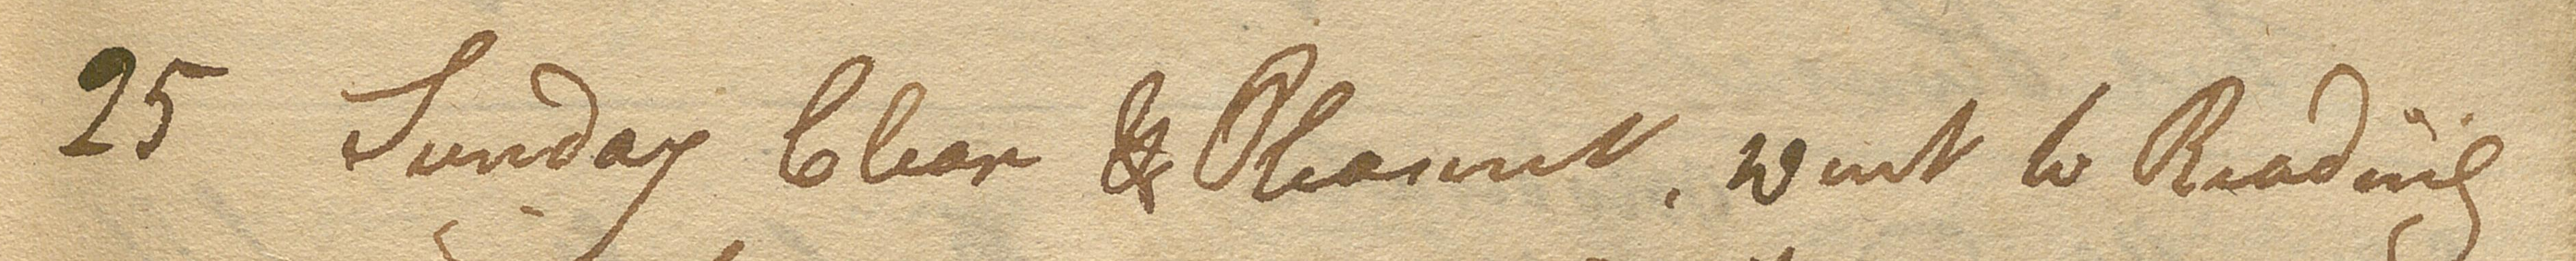25 Sunday Clear & Pleasent, went to Reading
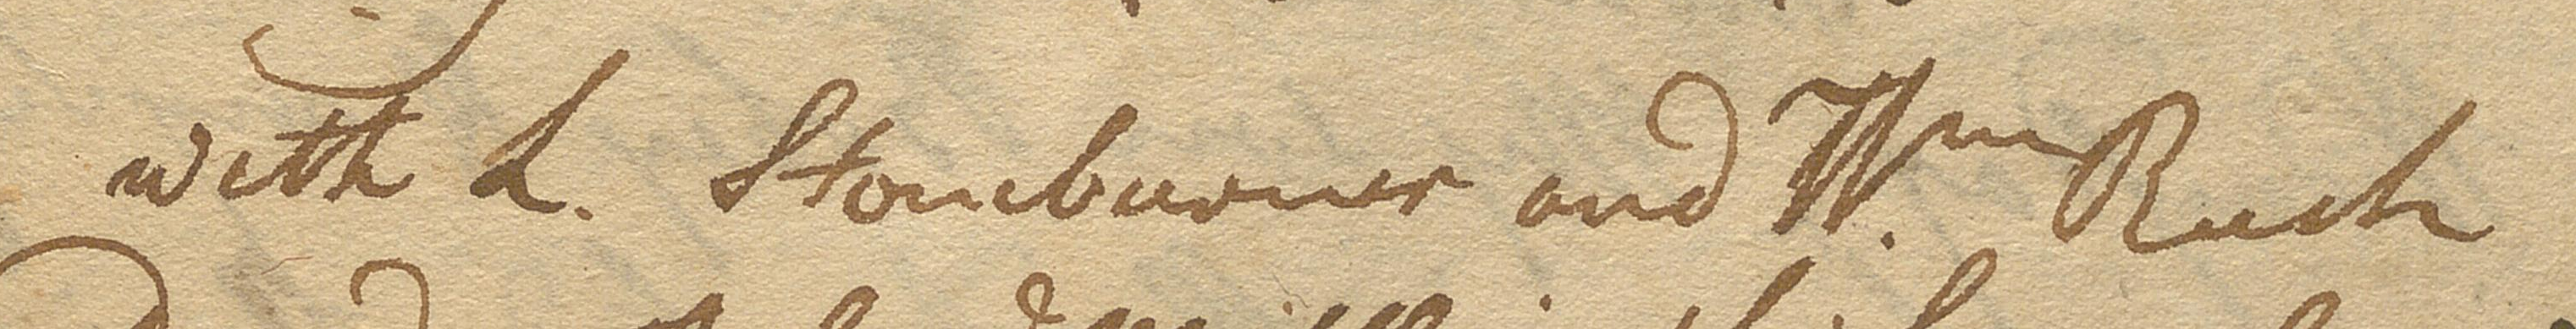with L. Stoneburner and W^m Rush
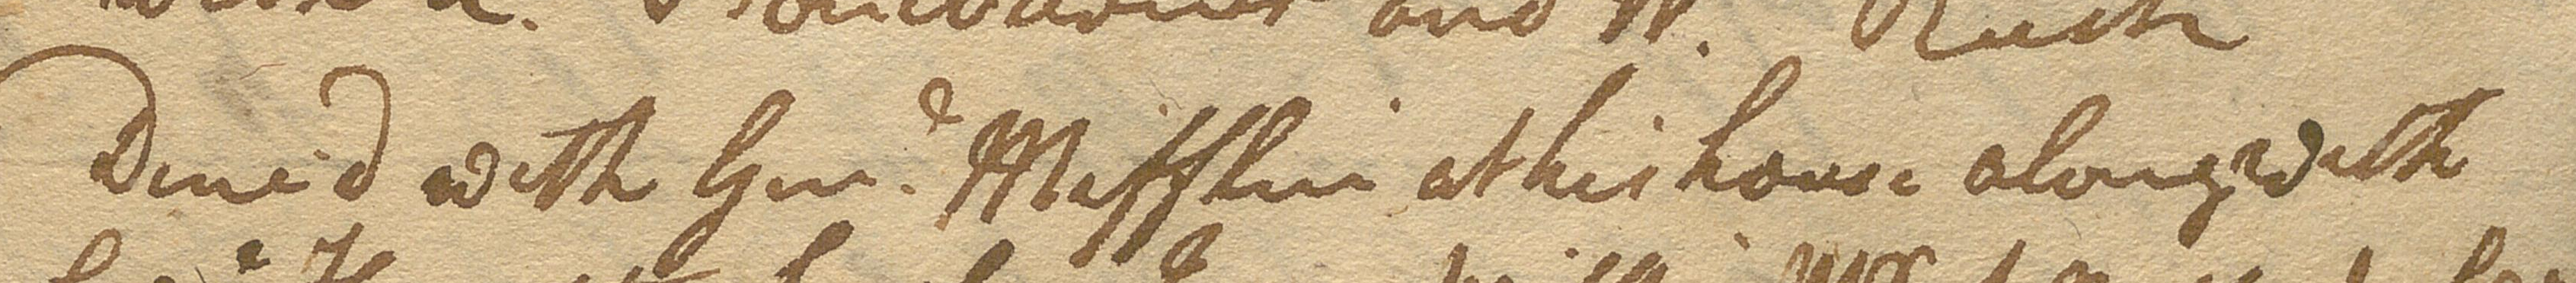Dine'd with Gen^l. Mifflin at his house along with
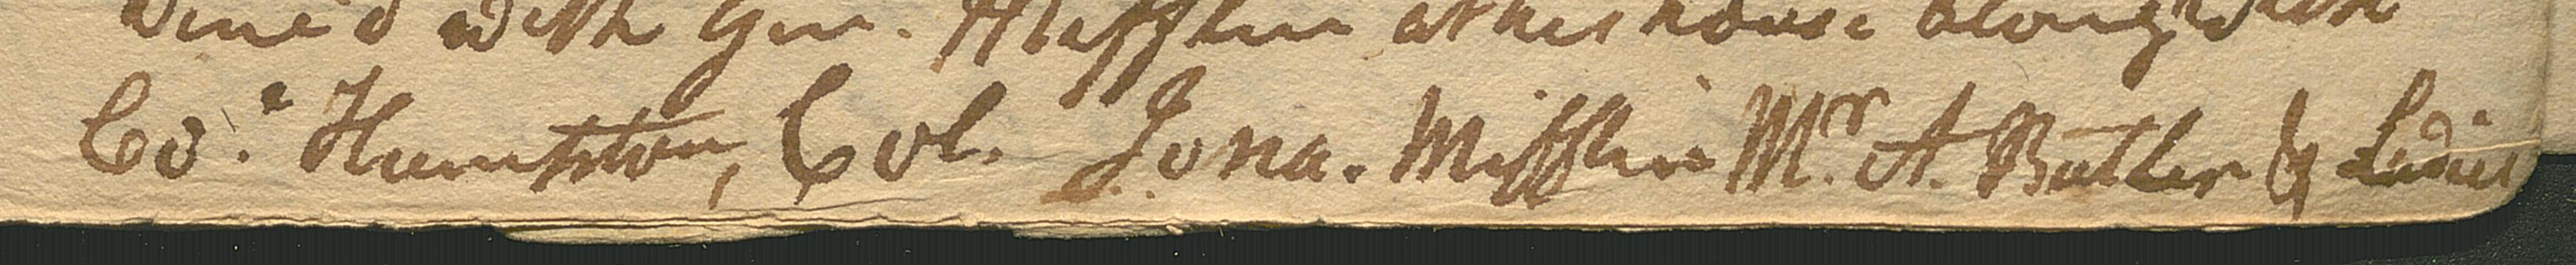Co^l. Humpton, Col. Jona. Mifflin M^r. A. Butler & Ladies
